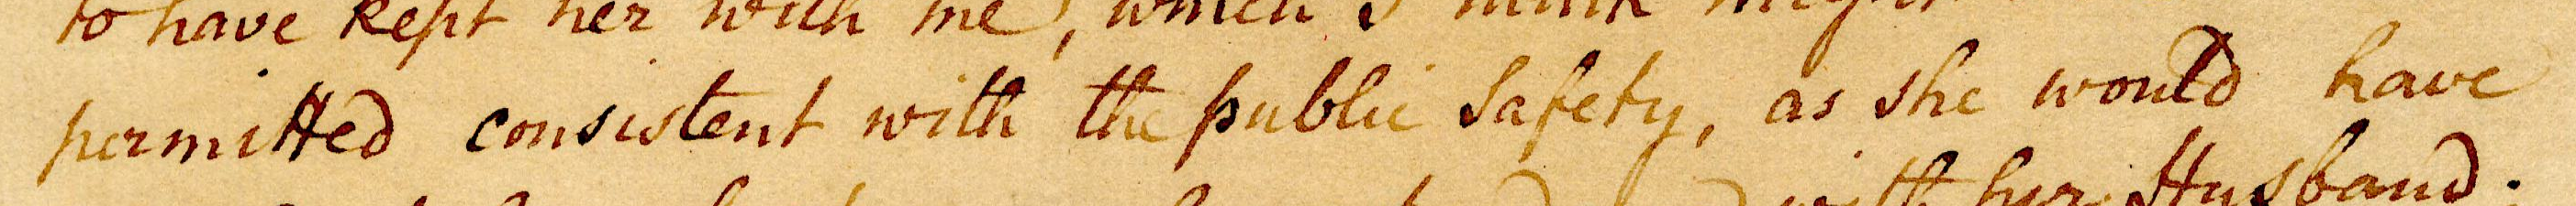permitted consistent with the public safety, as she would have
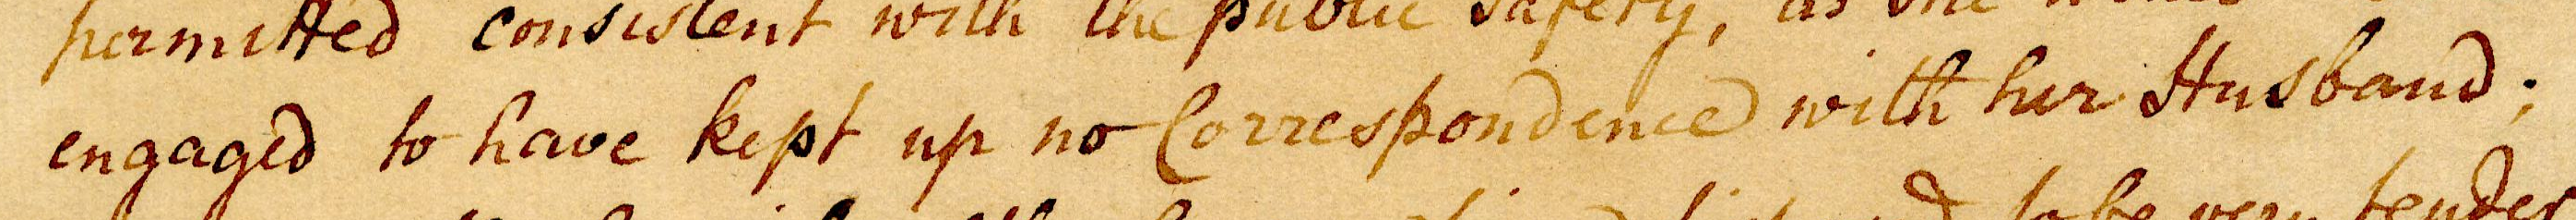engaged to have kept up no Correspondence with her Husband;
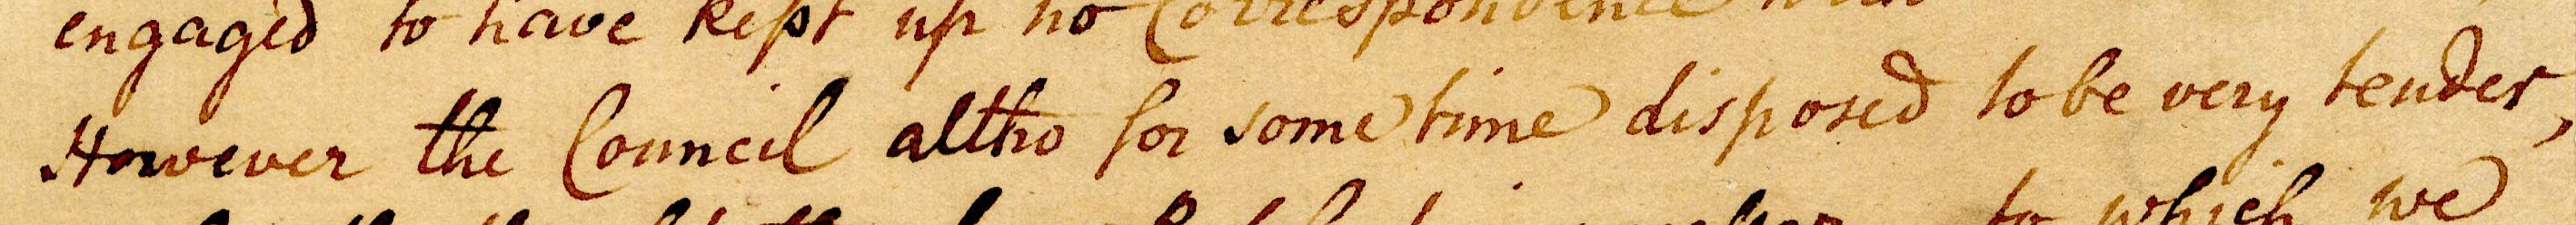However the Council altho for some time disposed to be very tender,
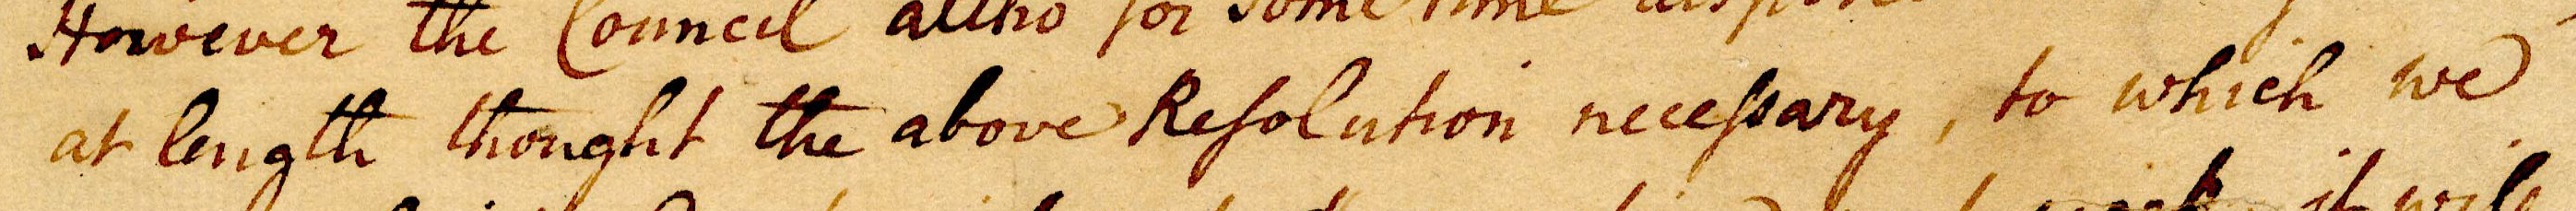at length thought the above Resolution necessary, to which we
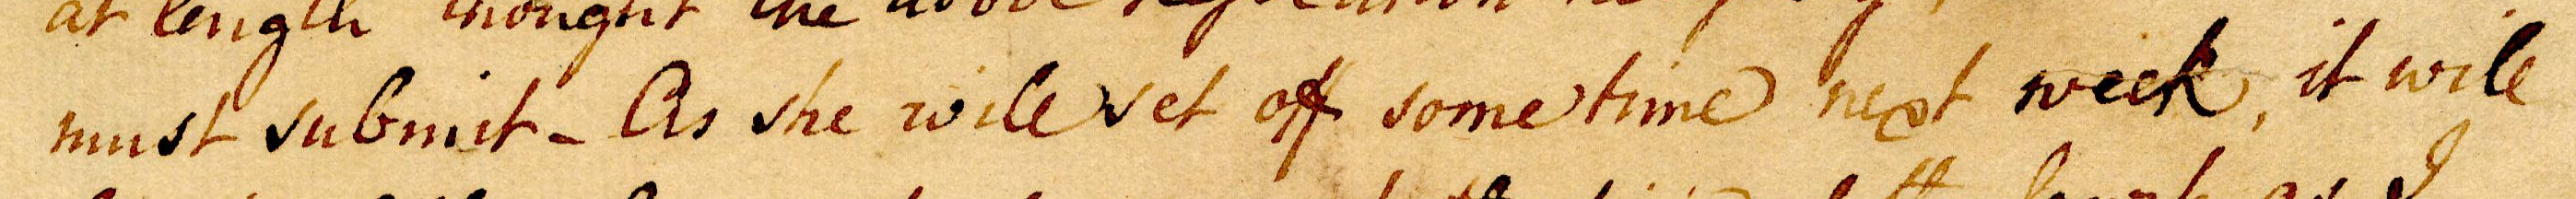must submit- As she will set off sometime next week, it will
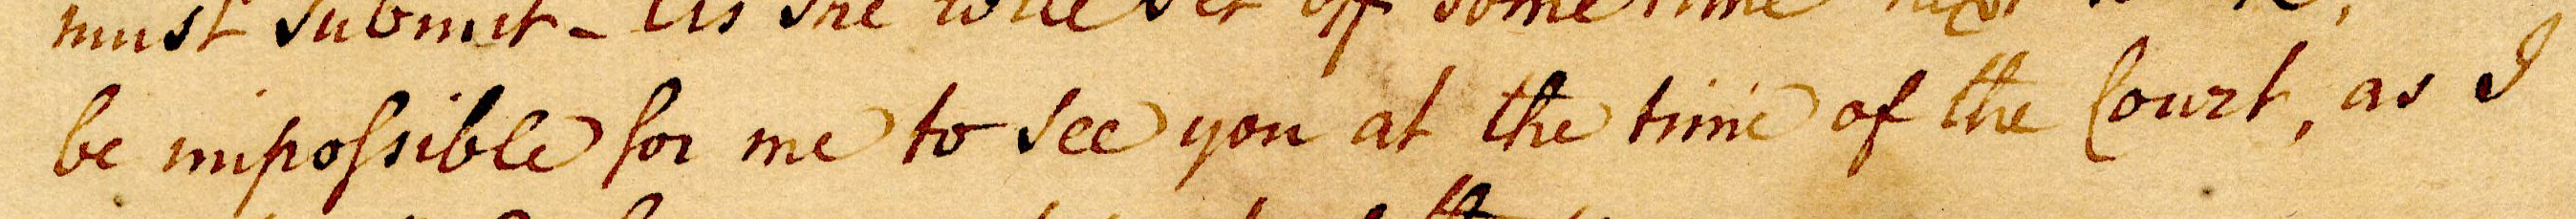be impossible for me to see you at the time of the Court, as I
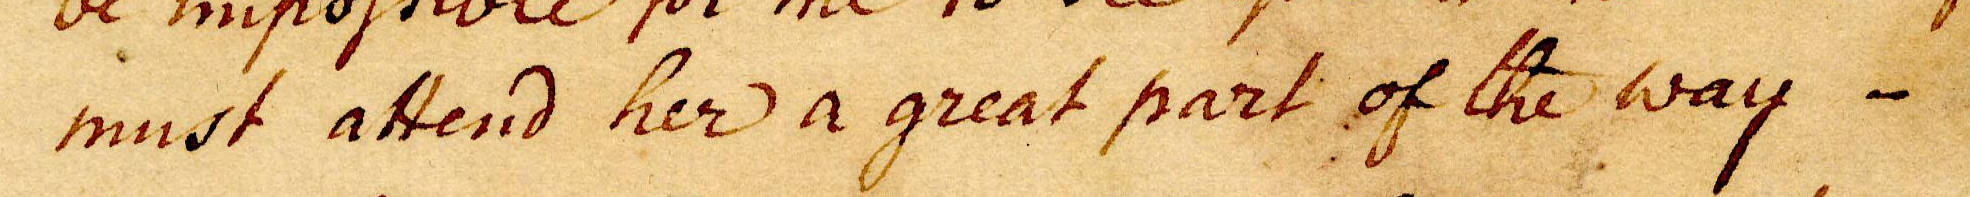must attend her a great part of the way-
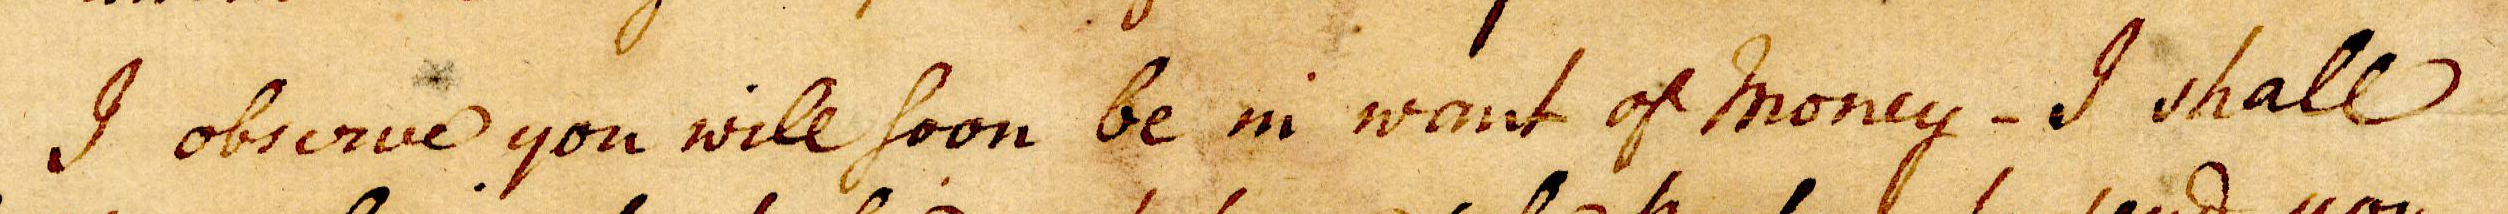I observe you will soon be in want of Money- I shall
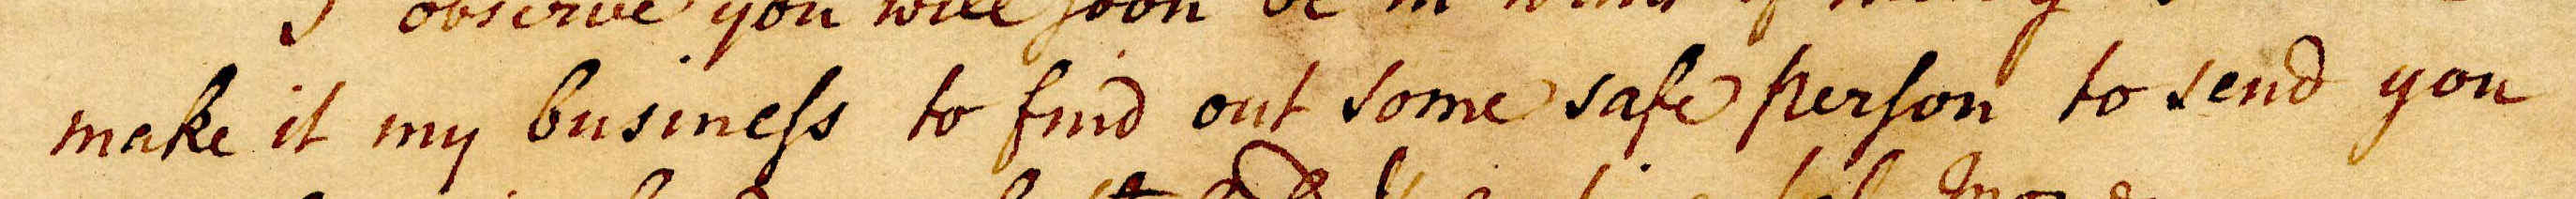make it my business to find out some safe person to send you
